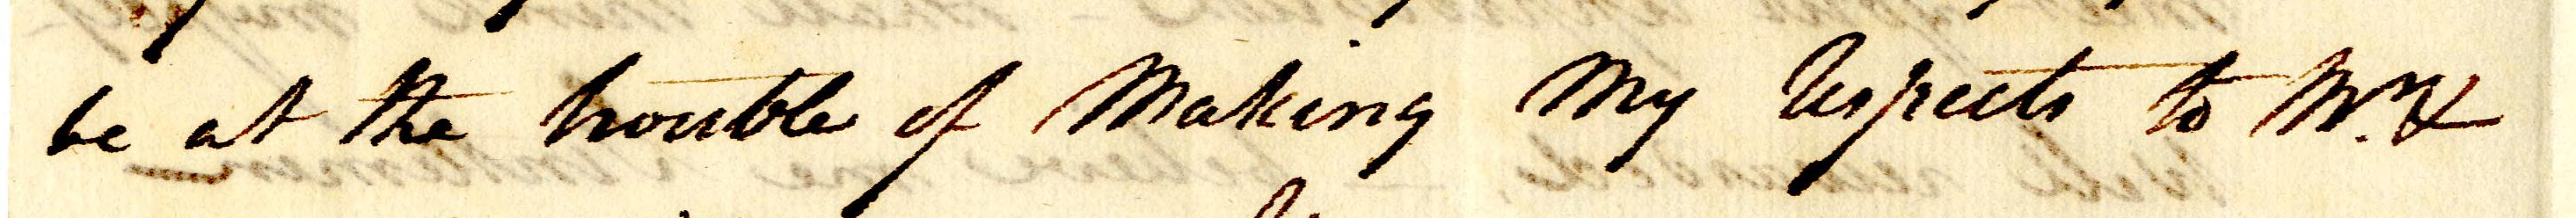be at the trouble of making my respects to M^r &
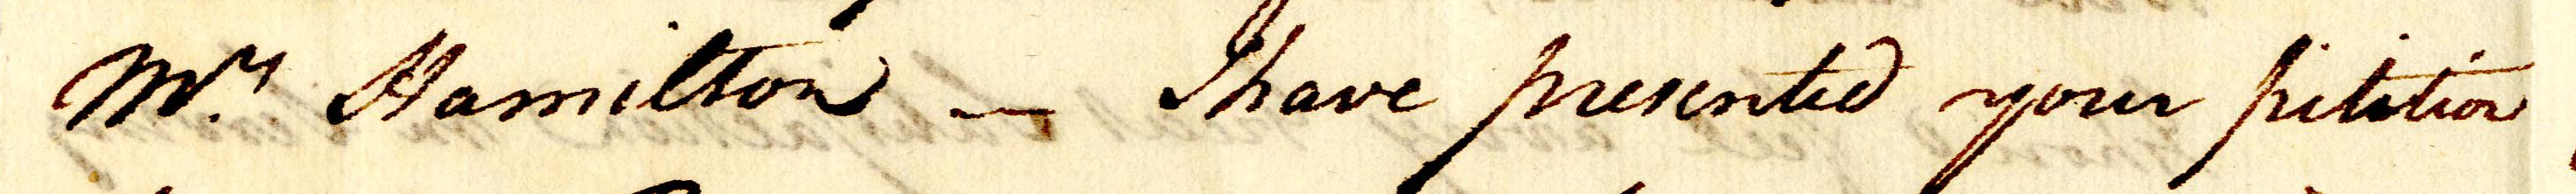M^rs Hamilton.- I have presented your pitition
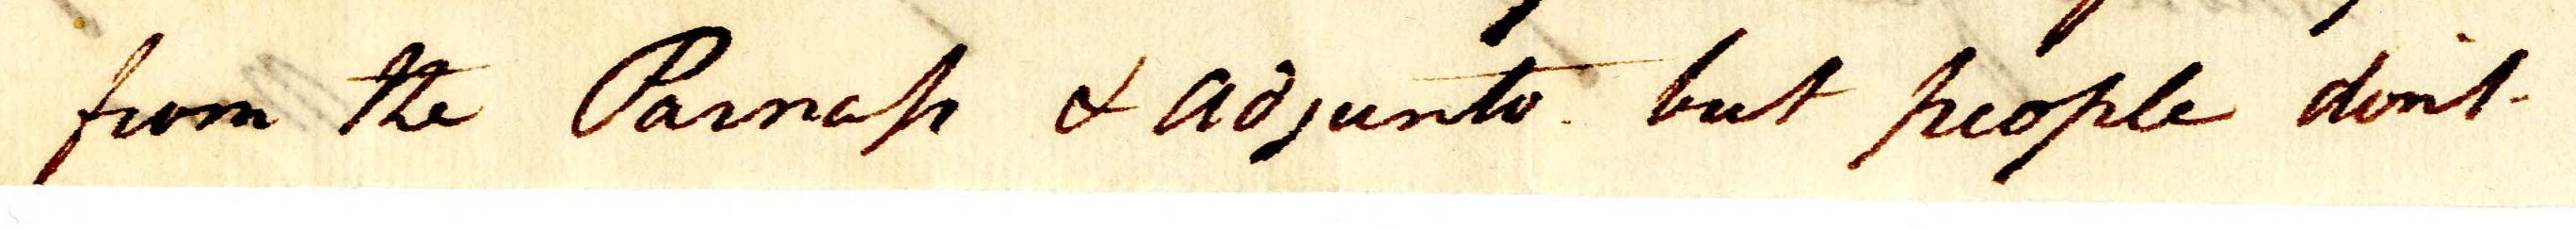from the Parnass & Adjunts but people dont
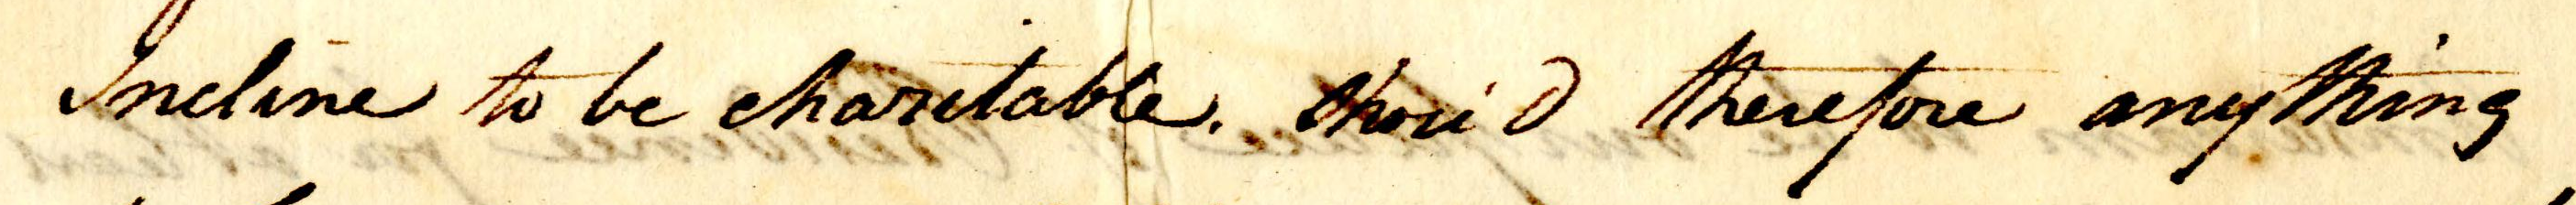Incline to be charitable. shou'd therefore any thing
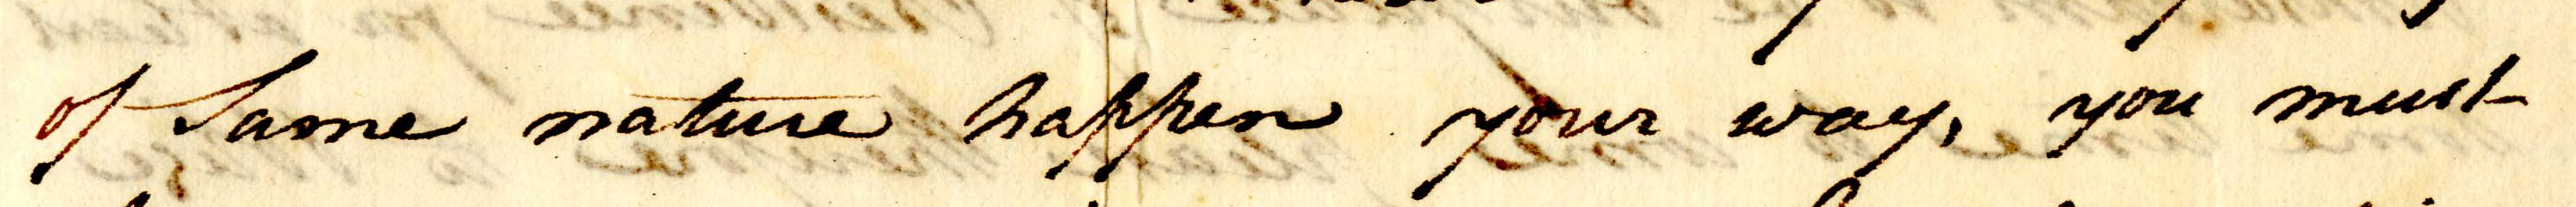of same nature happen your way, you must
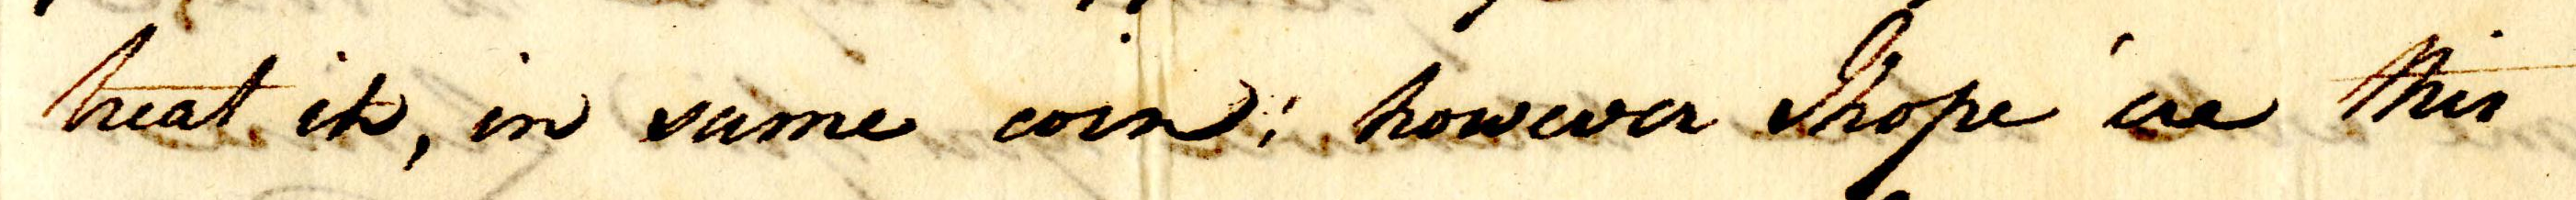treat it, in same coin; however I hope in this
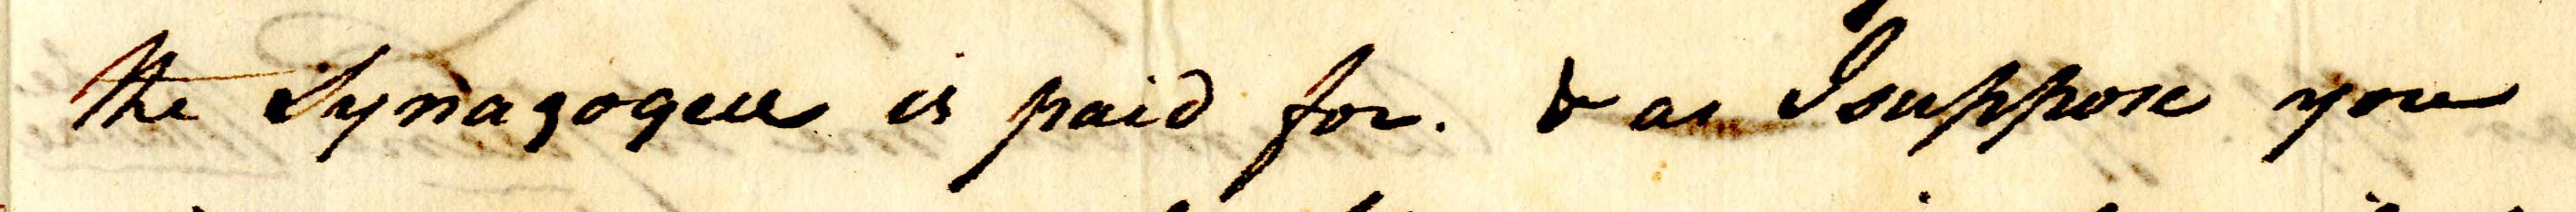the synagogue is paid for. & as I suppose you
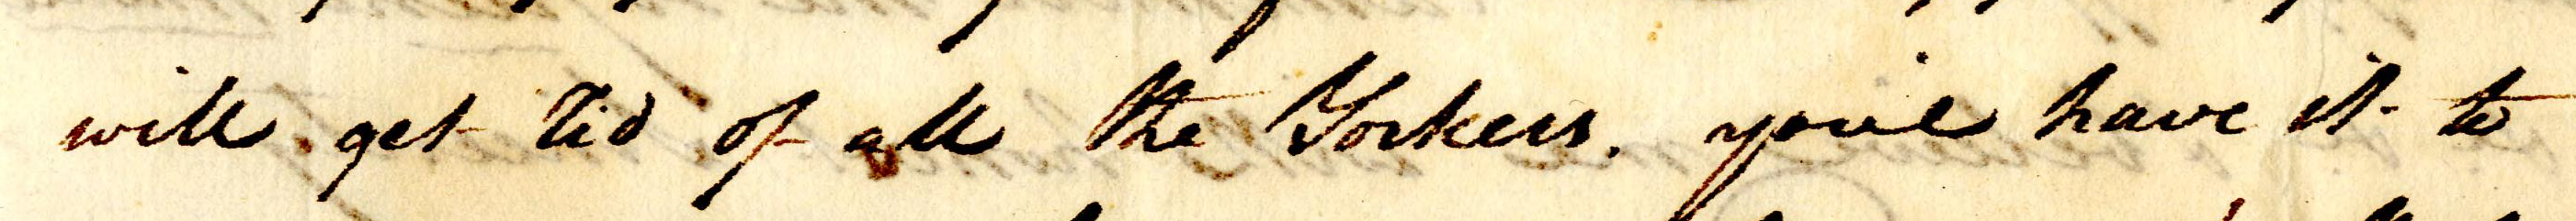will get rid of all the Yorkers, you'l have it to
